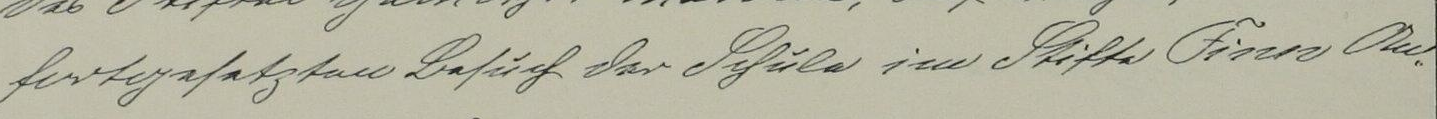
fortgesetzten Besuch der Schule im Stift Finn An-
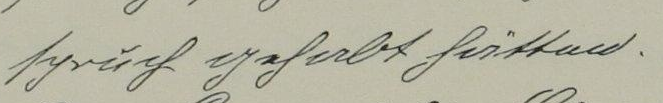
spruch gehabt hätten.
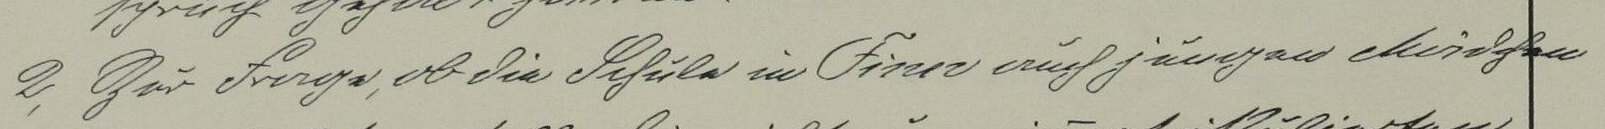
2. Zur Frage, ob die Schule in Finn auch jungen Mädchen
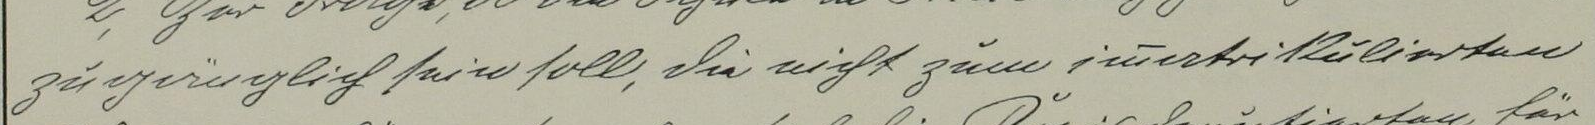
zugänglich sein soll, die nicht zum immatrikulierten
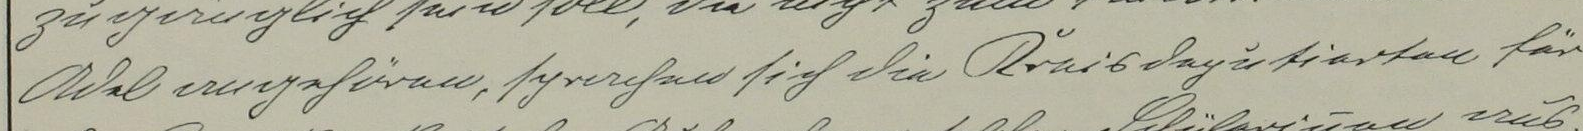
Adel angehören, sprachen sich die Kreisdeputierten für
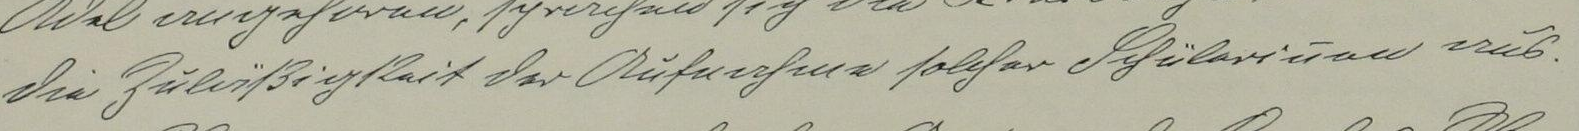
die Zuläßigkeit der Aufnahme solcher Schülerinnen aus.
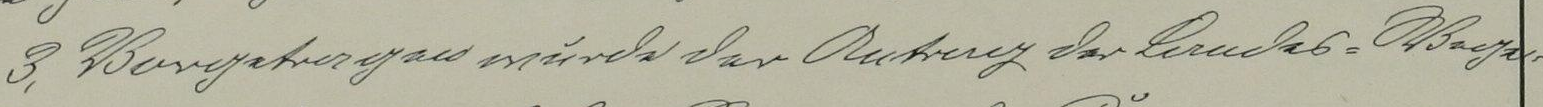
3. Vorgetragen wurde der Antrag der Landes-Wege-
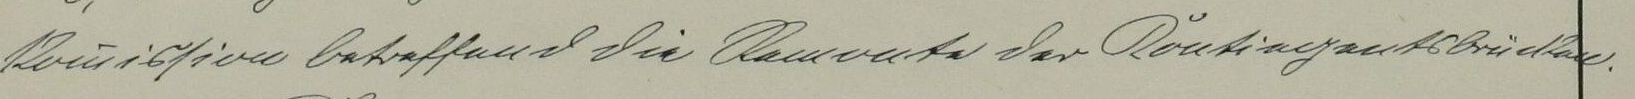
kommission betreffend die Remonte der Kontingentsbrücken.
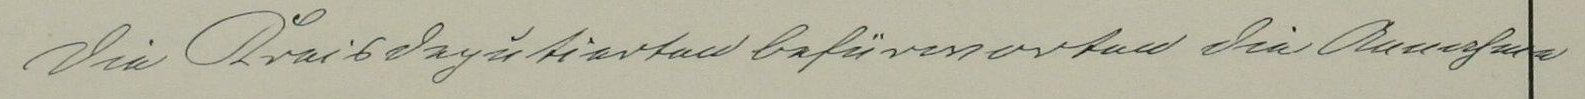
Die Kreisdeputierten befürworten die Annahme
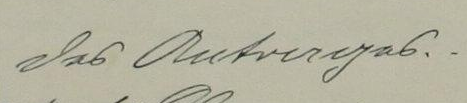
des Antrages.
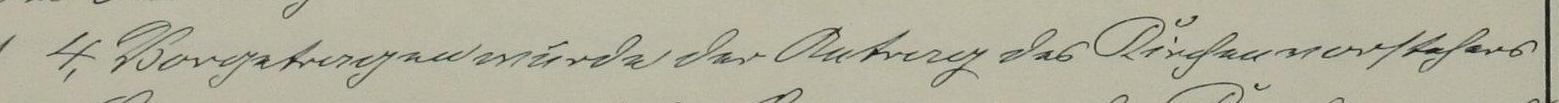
4. Vorgetragen wurde der Antrag des Kirchenvorstehers
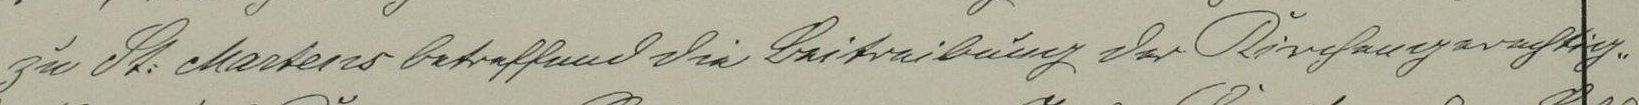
zu St. Martens betreffend die Beitreibung der Kirchengerechtig-
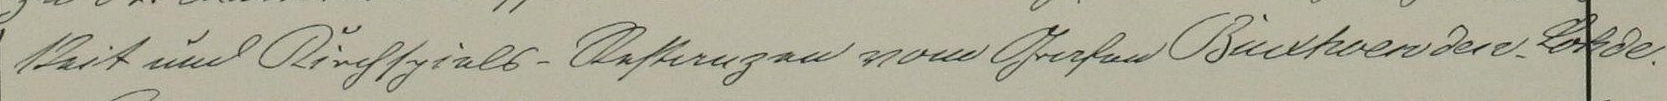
keit und Kirchspiels-Restanzen vom Grafen Buxhoewden-Lohde.
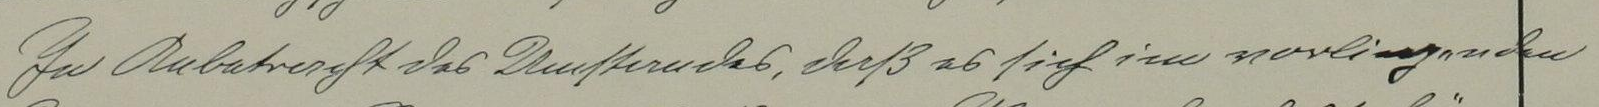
In Anbetracht des Umstandes, daß es sich im vorliegenden
